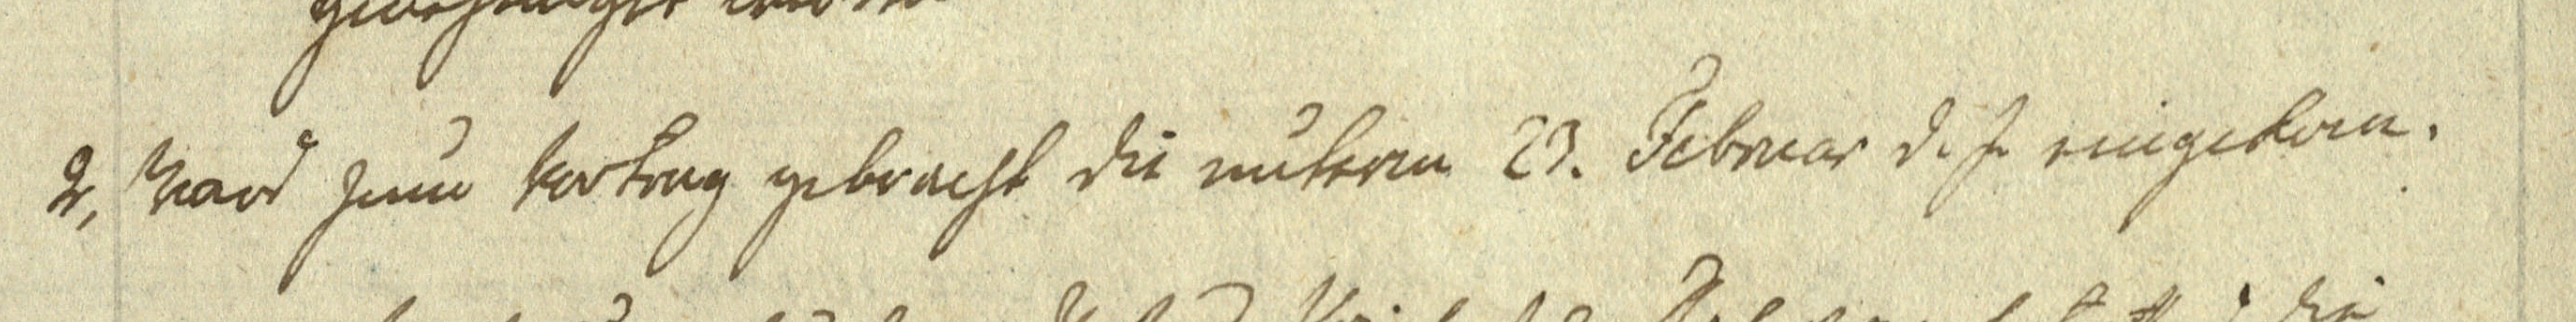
2, Ward zum Vortrag gebracht die unterm 23. Februar d. J. eingekom¬
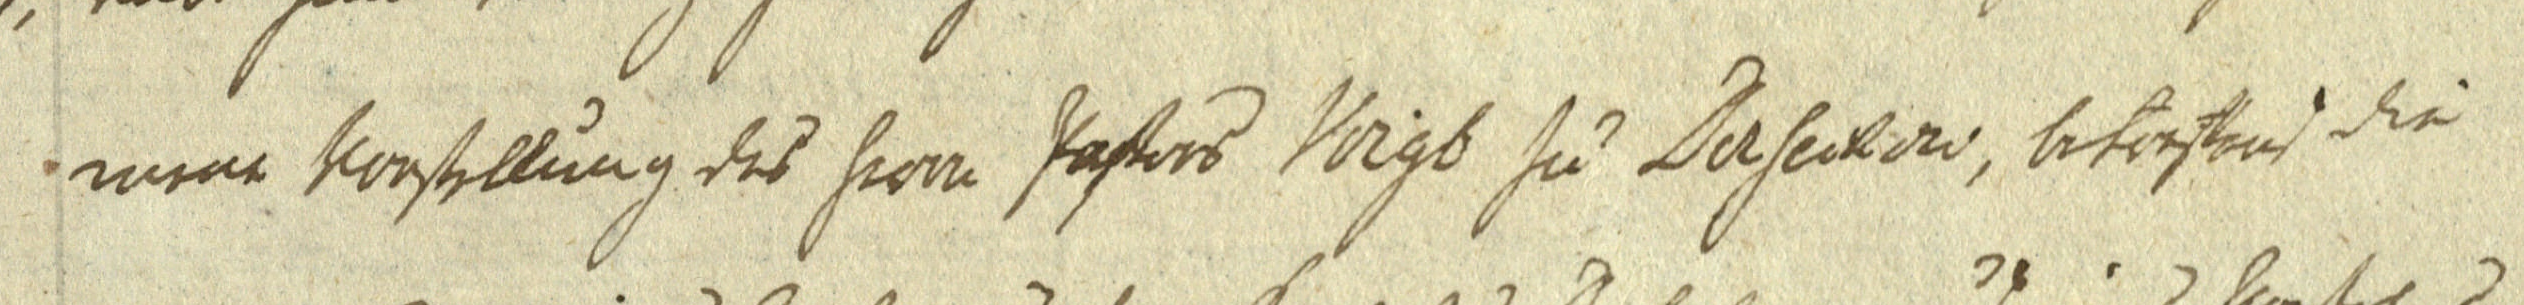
mene Vorstellung des Herrn Pastors Voigt zu Derseckow, betreffend die
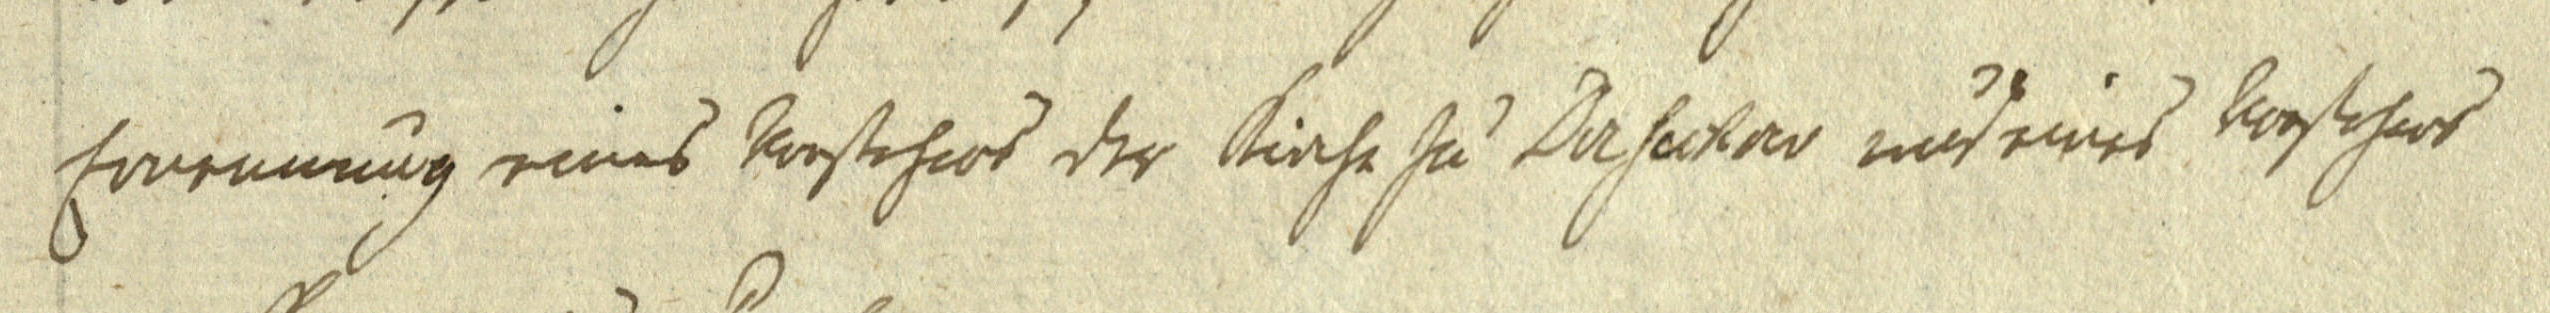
Ernennung eines Vorstehers der Kirche zu Derseckow und eines Vorstehers
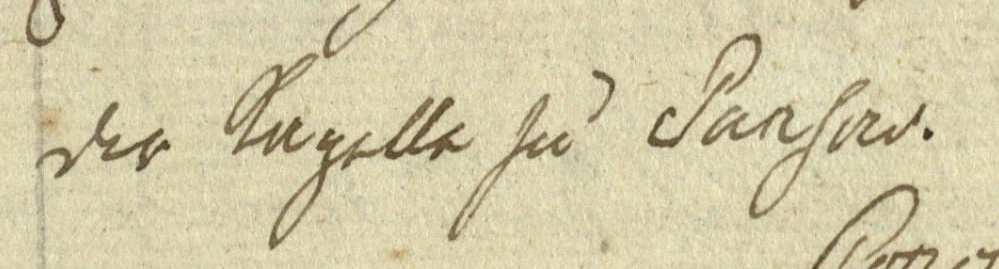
der Kapelle zu Pansow.
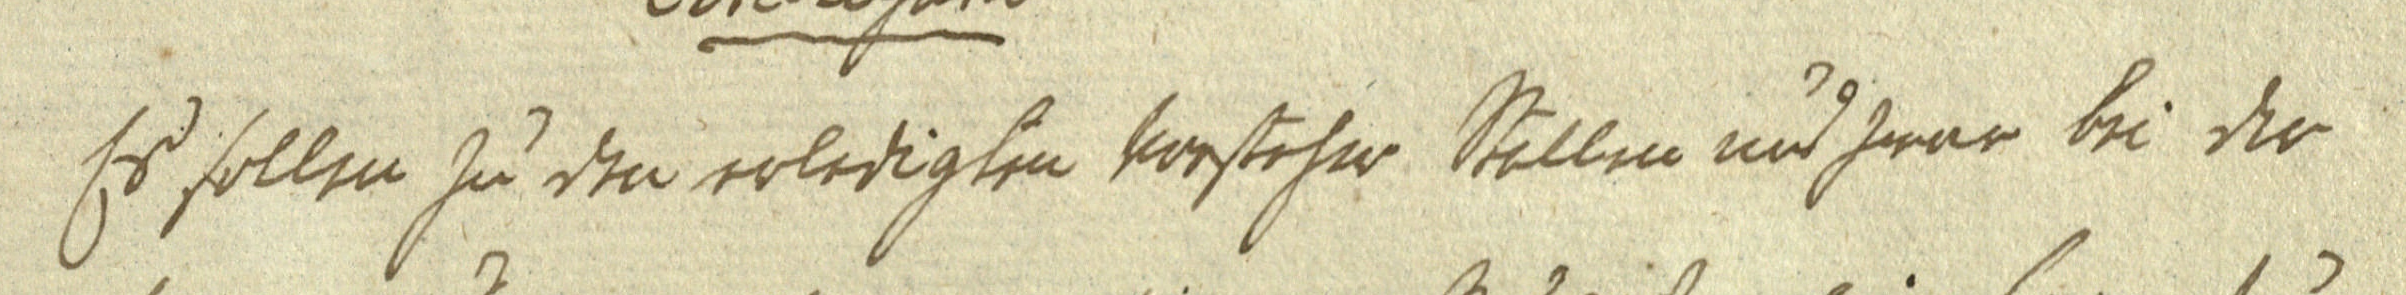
Er sollen zu den erledigten Vorsteher Stellen und zwar bei der
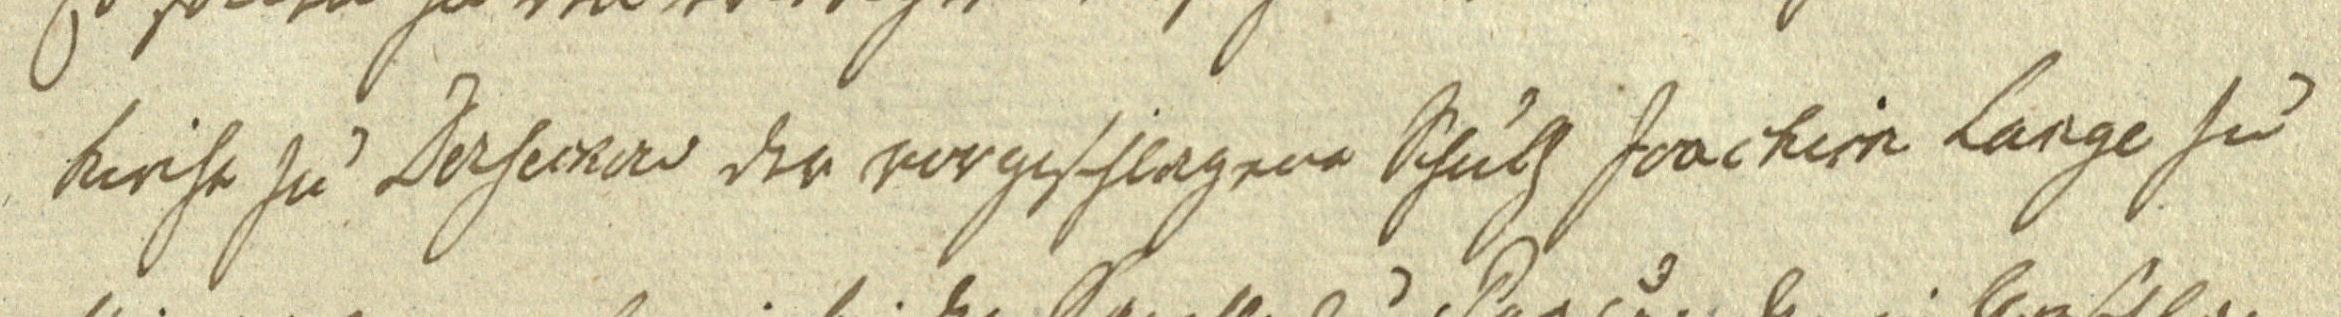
Kirche zu Derseckow der vorgeschlagene Schulz Joachim Lange zu
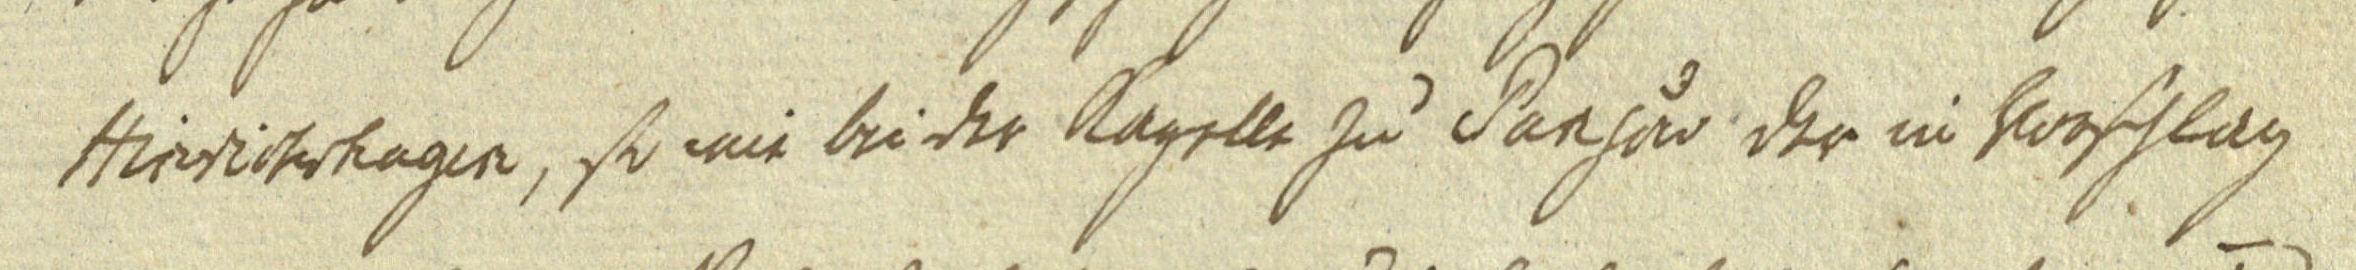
Hinrichshagen, so wie bei der Kapelle zu Pansow der in Vorschlag
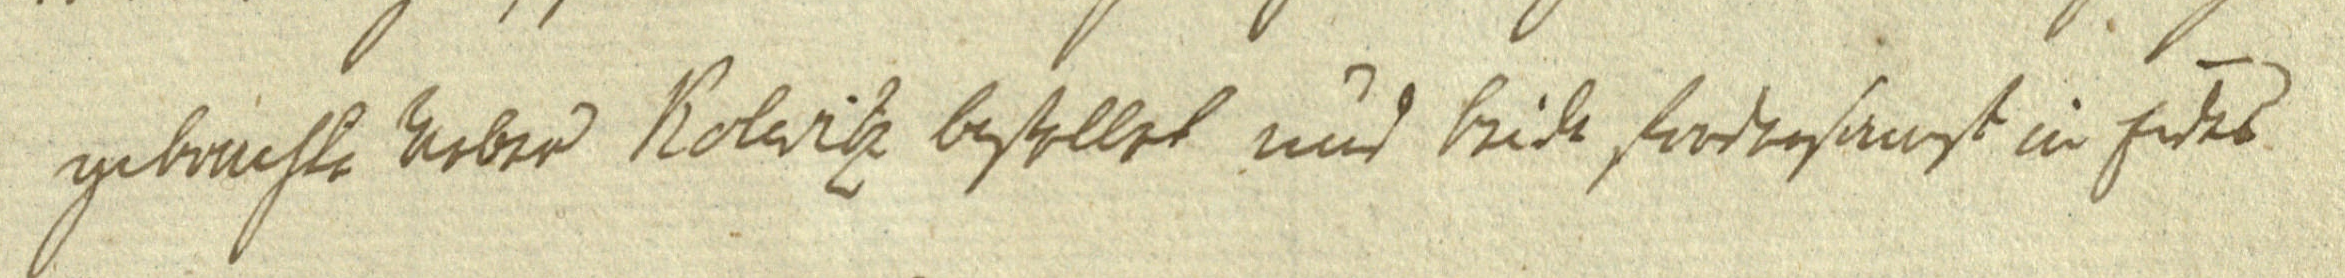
gebrachte Weber Kolwitz bestellet und beide fordersamst in Eides
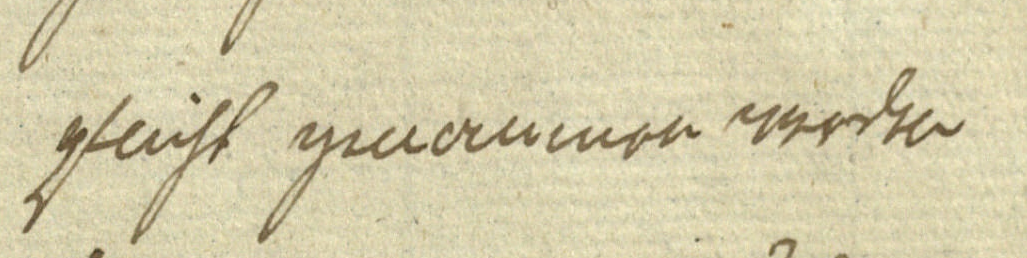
pflicht genommen werden.
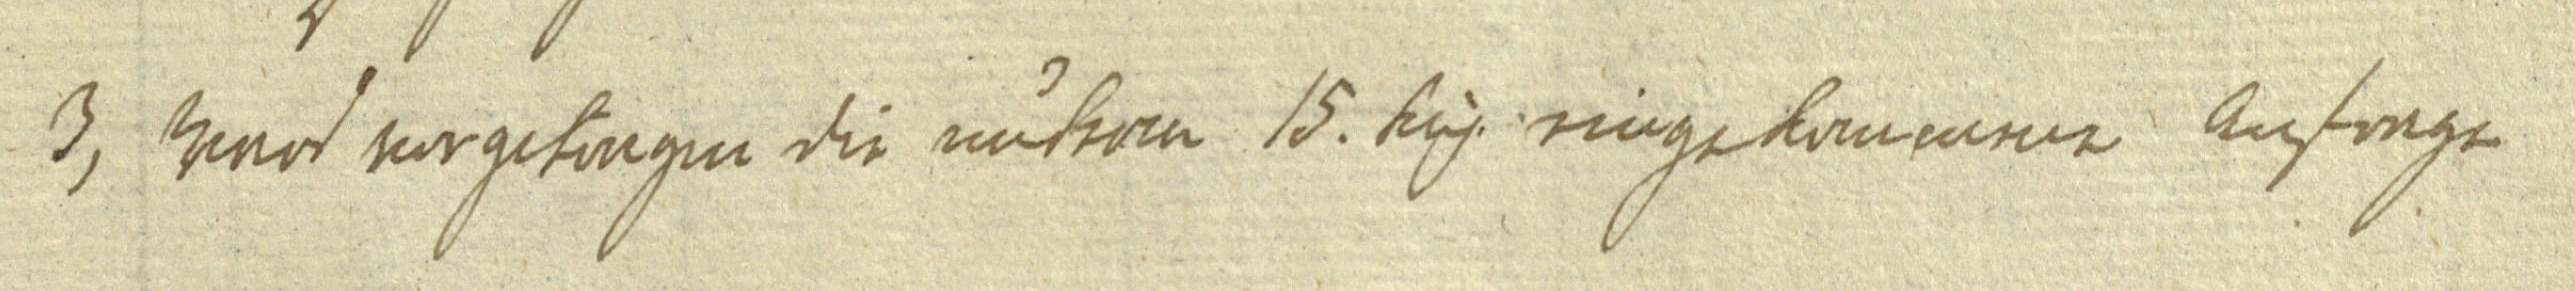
3, Wird vorgetragen die unterm 15. huj. eingekommene Anfrage
